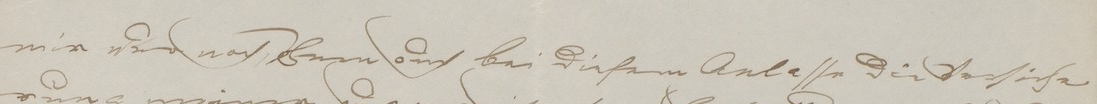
mir nur noch, Ihnen auch bei diesem Anlasse die Versiche-
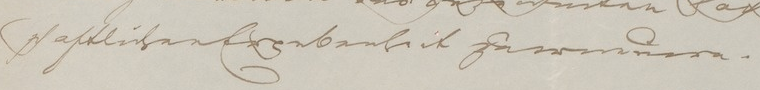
schaftlichen Ergebenheit zu erneuern.
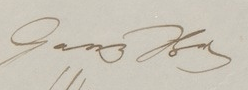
Ganz Ihr
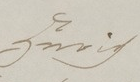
Zürich
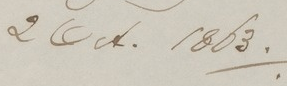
2 Oct. 1863.
